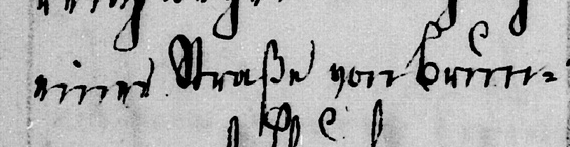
einer Straße von Brun¬
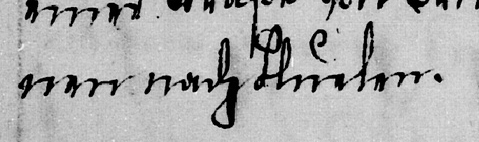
nen nach Fluelen
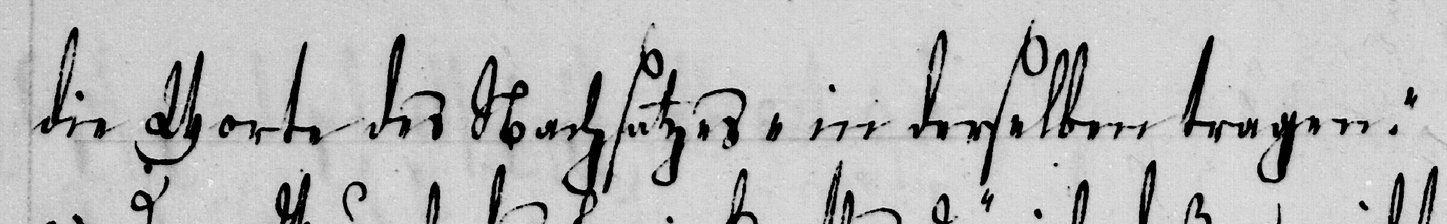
die Worte des Nachsatzes „in derselben tragen.“
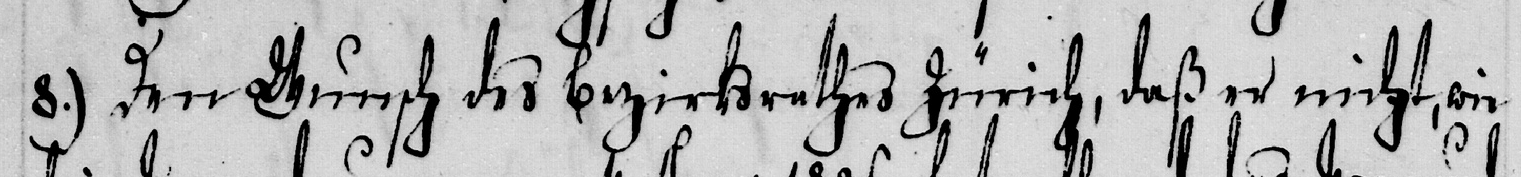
8.) Den Wunsch des Bezirsrathes Zürich, daß er nicht, wie
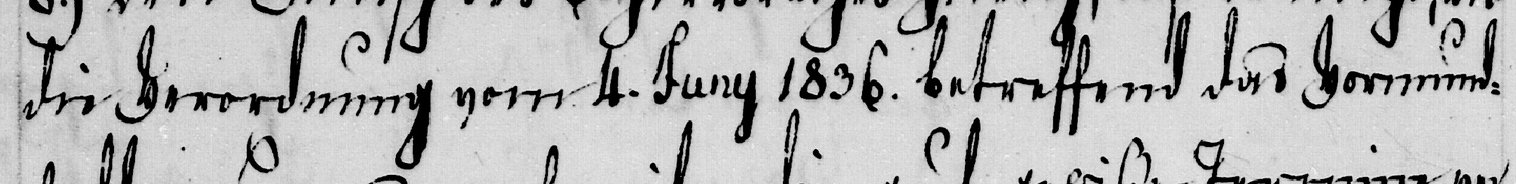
die Verordnung vom 4. Juny 1836. betreffend das Vormund¬
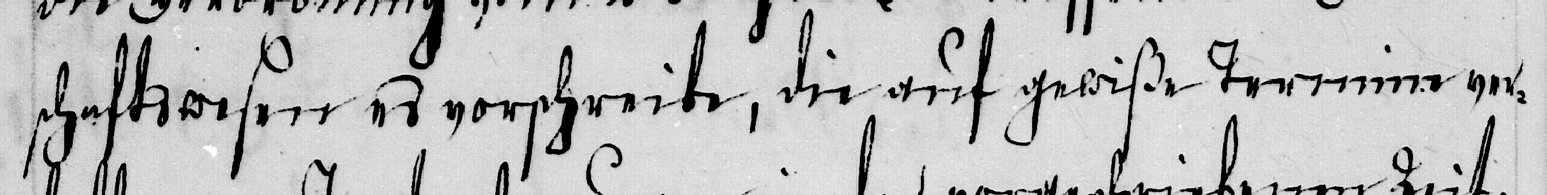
schaftswesen es vorschreibe, die auf gewiße Termine ver¬
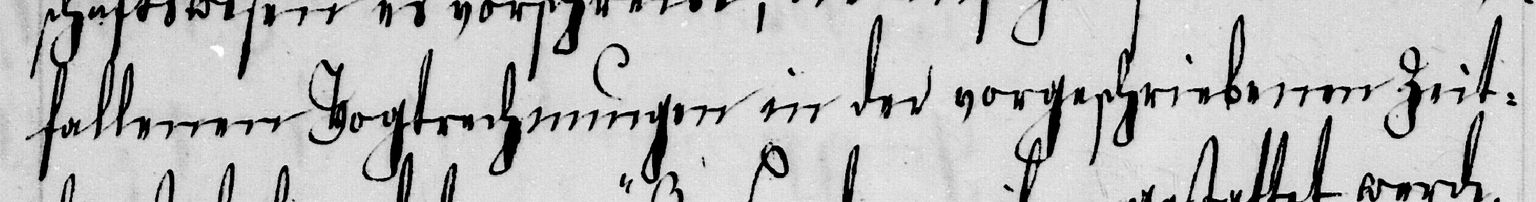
fallenen Vogtrechnungen in der vorgeschriebenen Zeit¬
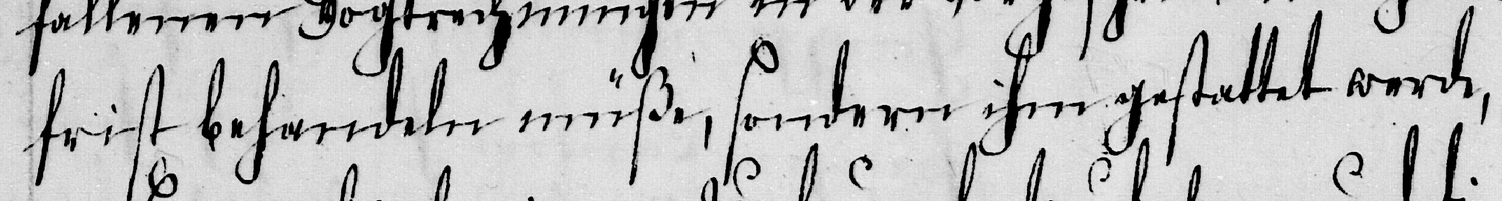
frist behandeln müße, sondern ihm gestattet werde,
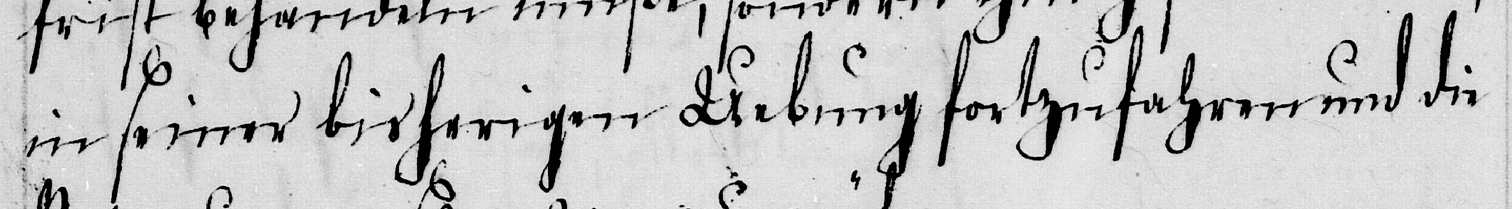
in seiner bisherigen Uebung fortzufahren und die
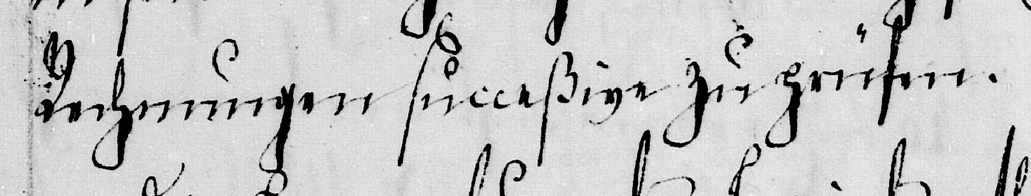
Rechnungen succeßive zu prüfen.
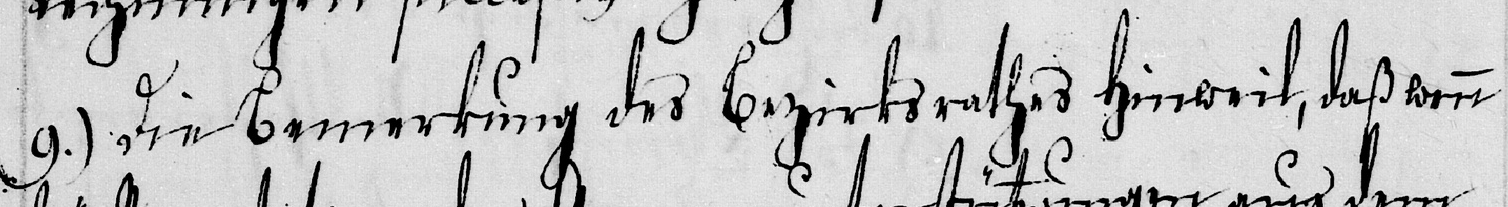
9.) Die Bemerkung des Bezirksrathes Hinweil, daß wen¬
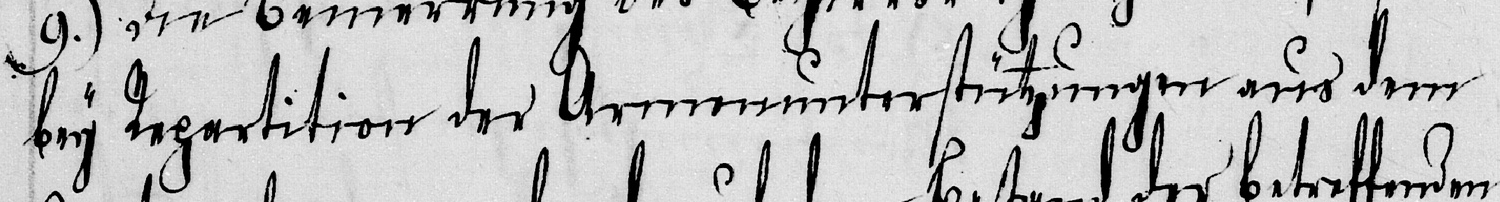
bey Repartition der Armenunterstützungen aus dem
